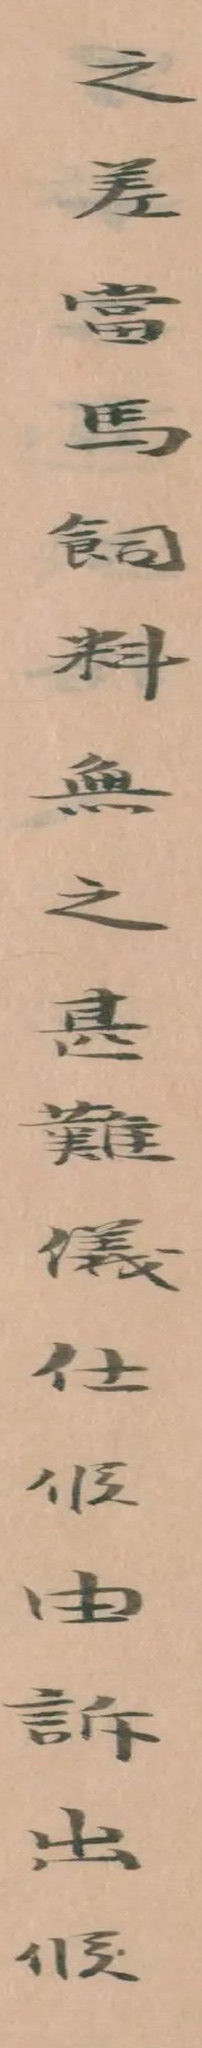之差当馬飼料無之甚難儀仕候由訴出候
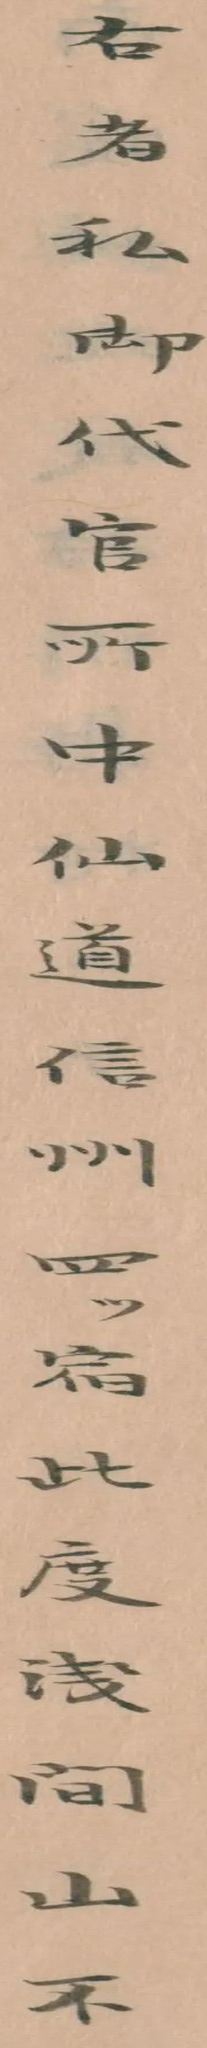右者私御代官所中仙道信州四ッ宿此度浅間山不
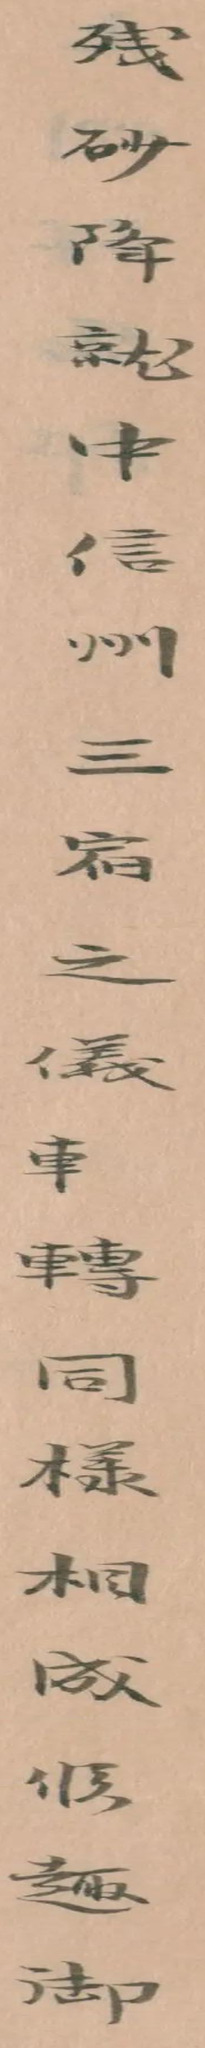残砂降就中信州三宿之儀転同様相成候趣御
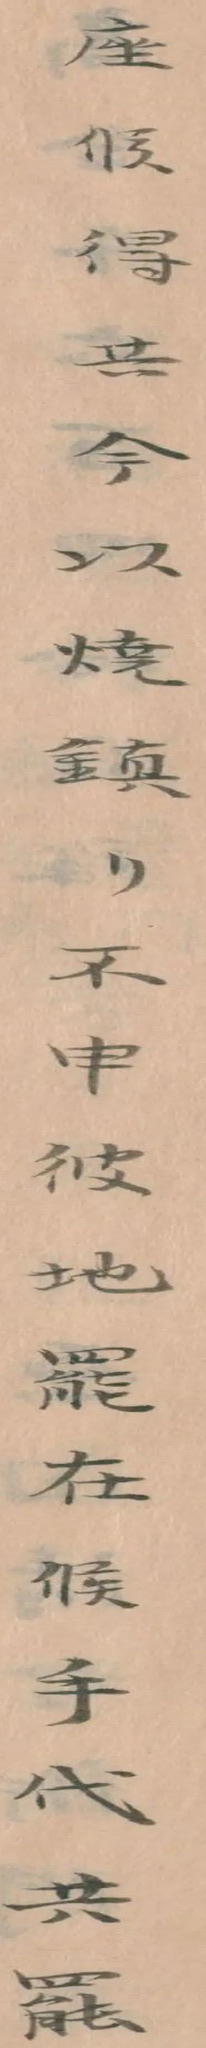座候得共今以焼鎮り不申彼地罷在候手代共罷
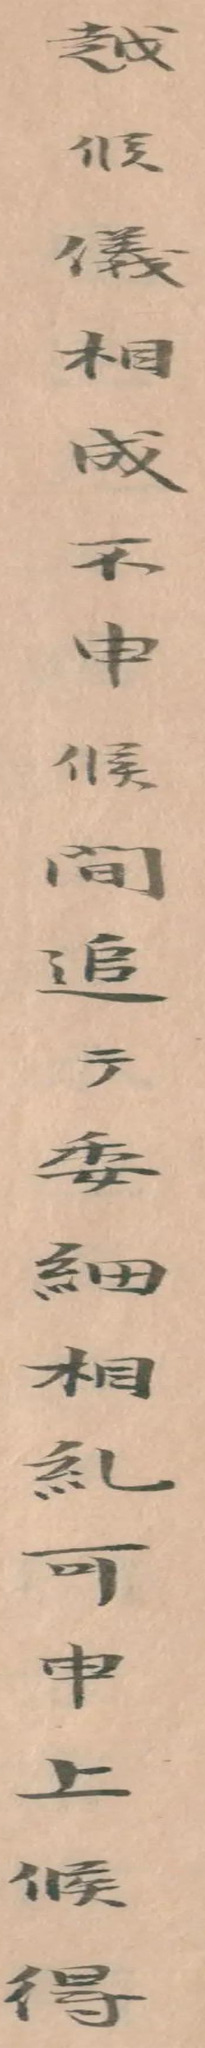越候儀相成不申候間追テ委細相糺可申上候得
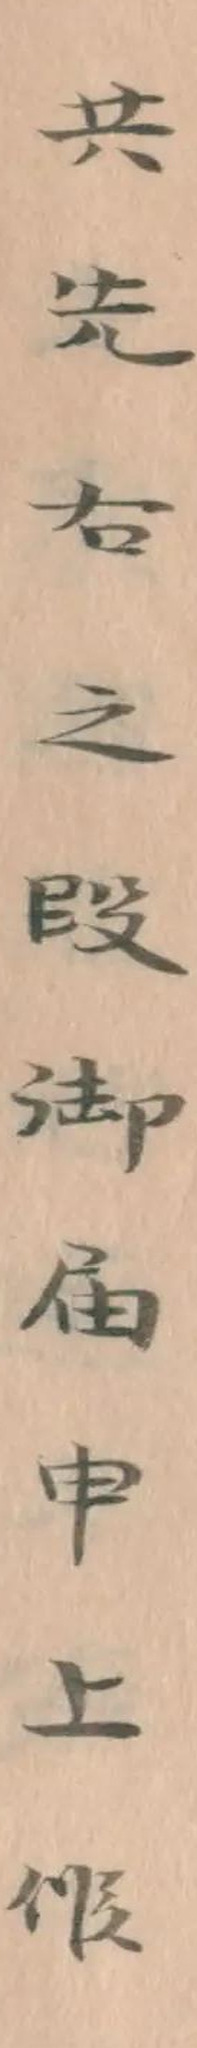共先右之段御届申上候
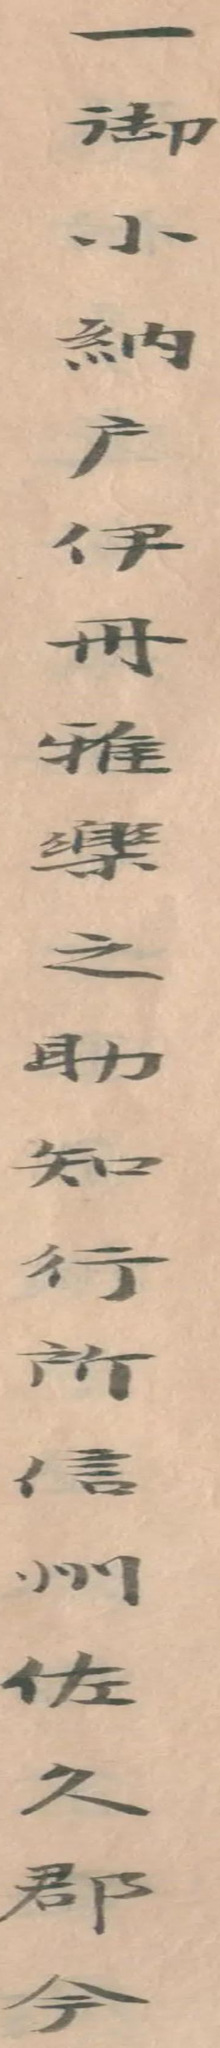一御小納戸伊丹雅楽之助知行所信州佐久郡今

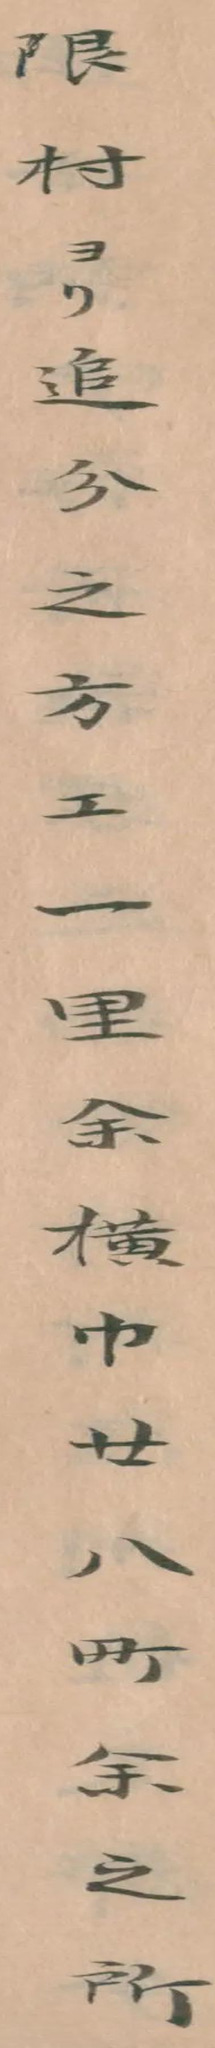限村ヨリ追分之方エ一里余横幅廿八町余之所
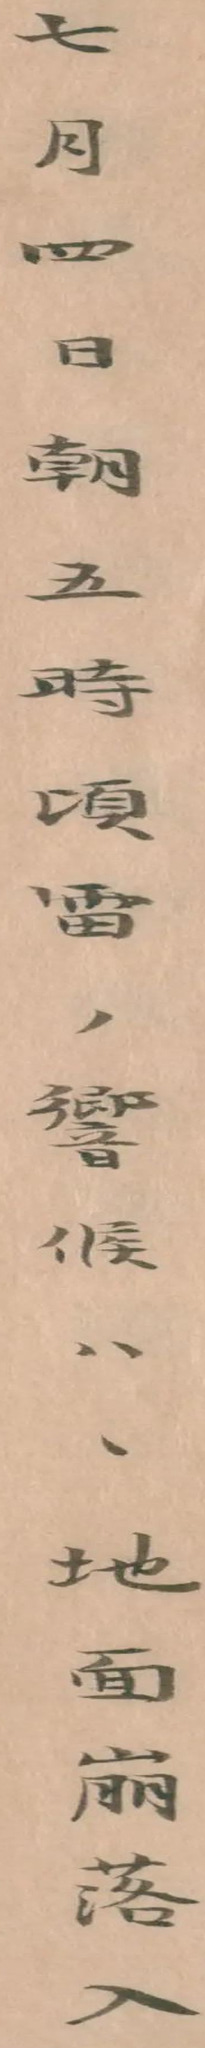七月四日朝五時頃雷ノ響候ハゝ地面崩落入
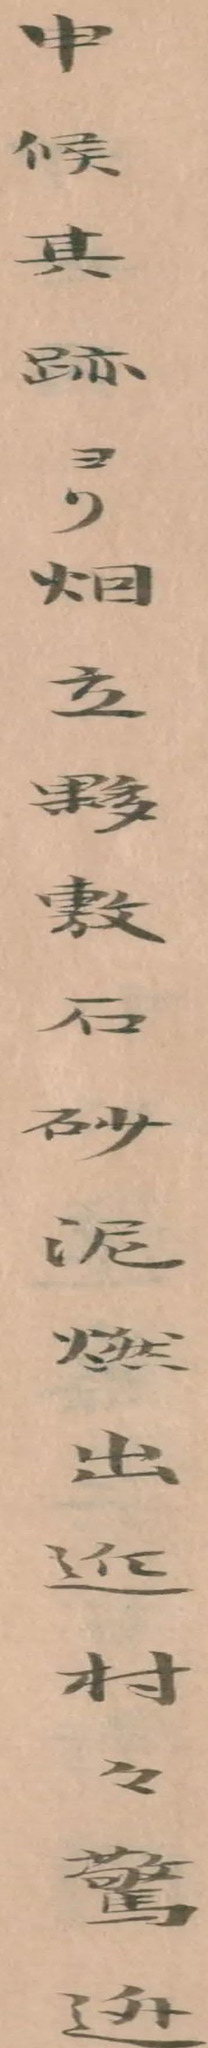申候其跡ヨリ烟立夥敷石砂泥燃出近村々驚
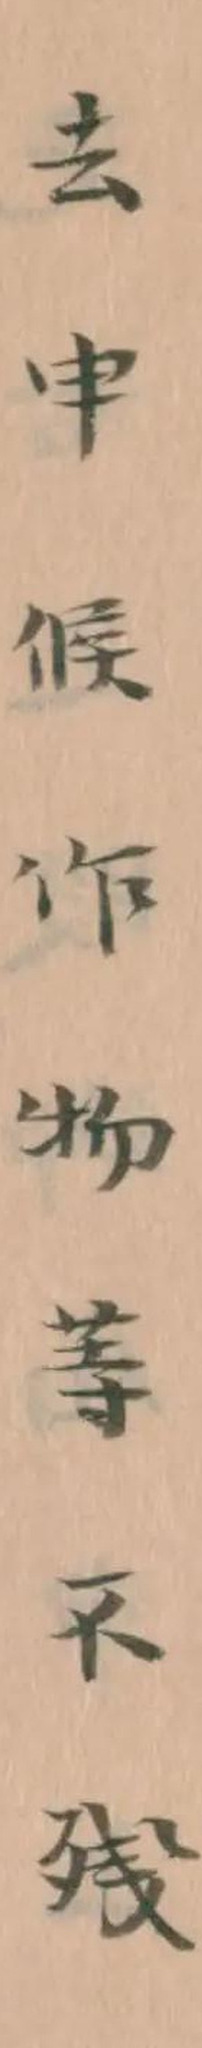去申候作物等不残
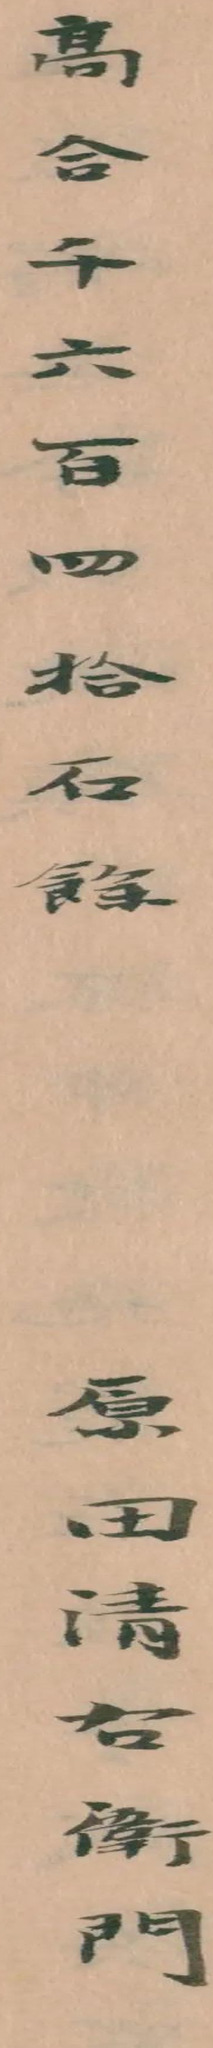高合千六百四拾石余原田清右衛門
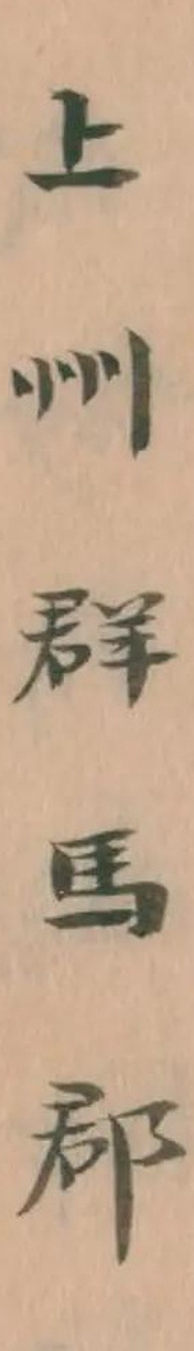上州群馬郡
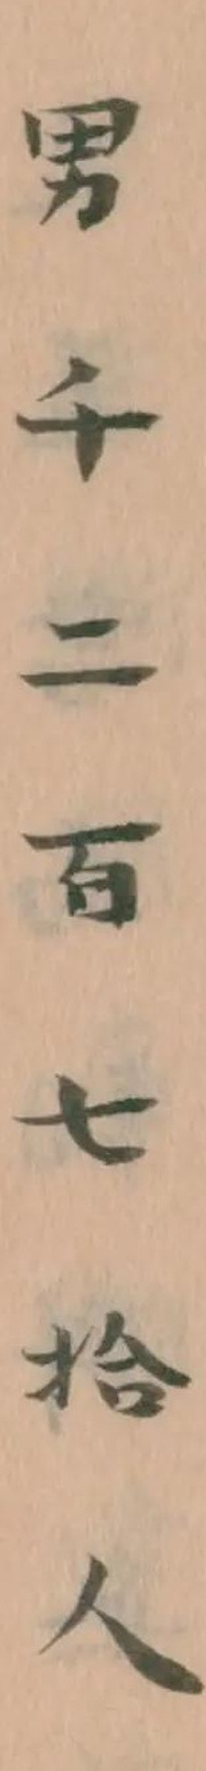男千二百七拾人
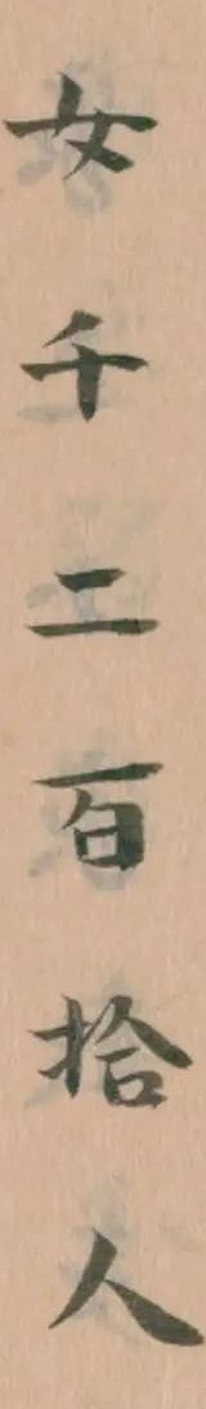女千二百拾人
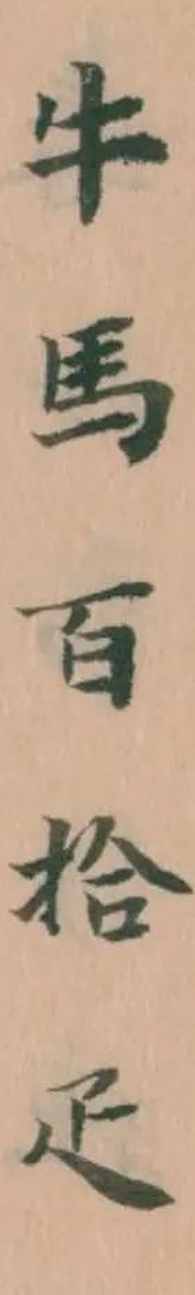牛馬百拾疋
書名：地災撮要. 巻1(噴火山・地震ノ部)
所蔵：国立国会図書館 National Diet Library, JAPAN
